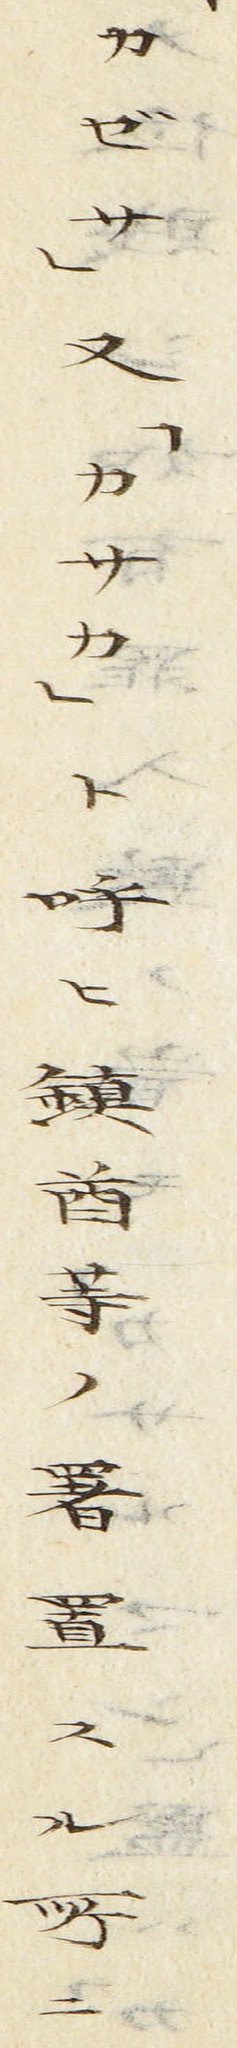「カゼサ」又「カサカ」ト呼ヒ鎮酋等ノ署置スル所ニ

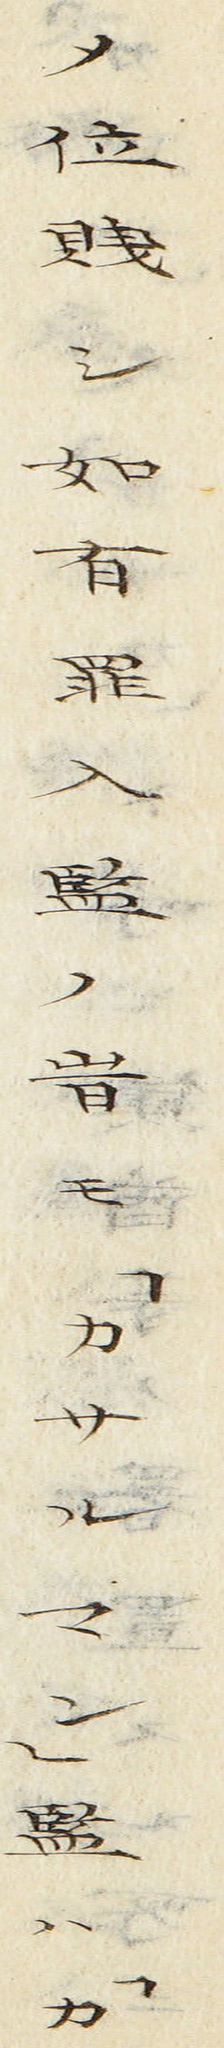シテ位賤シ如有罪入監ノ時モ「カサルマン」監ハ「カ
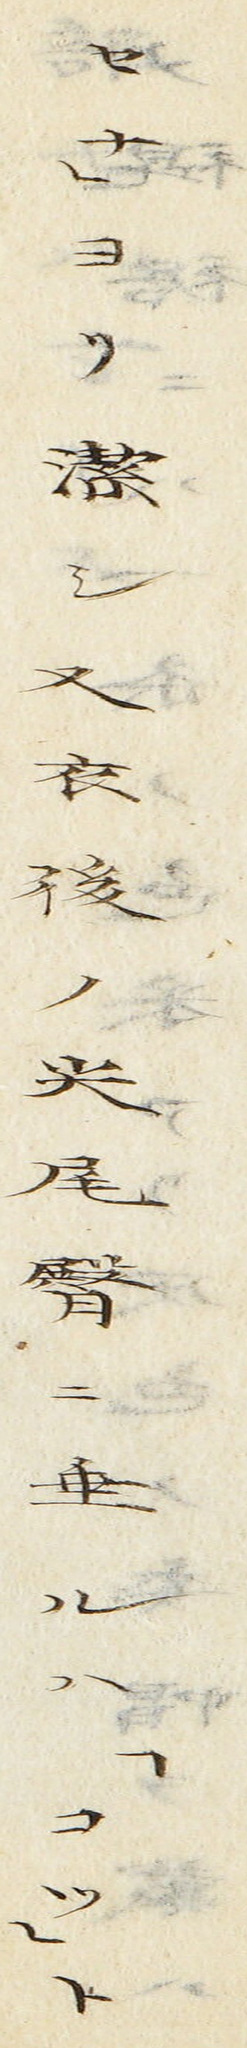セナ」ヨリ潔シ又衣後ノ尖尾臀ニ垂ルハ「コツ」ト
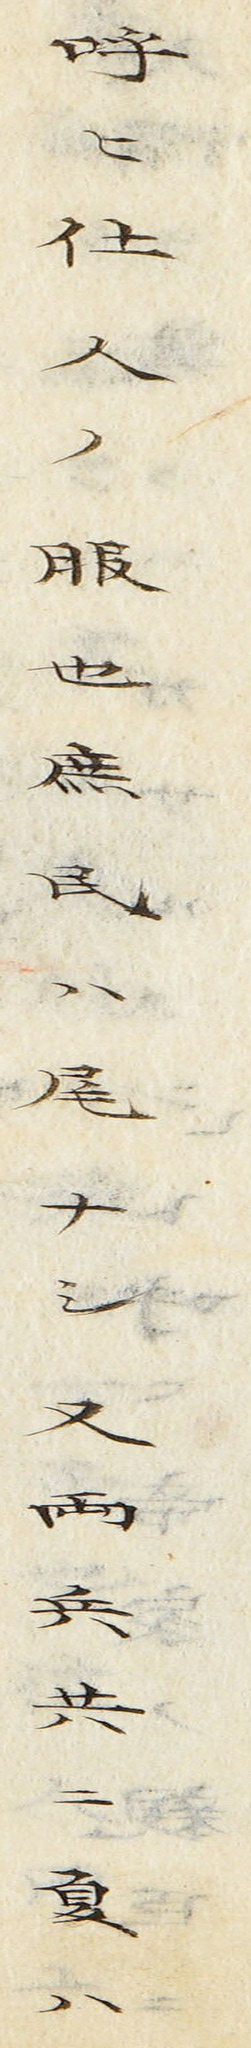呼ヒ仕人ノ服也庶民ハ尾ナシ又両兵共ニ夏ハ
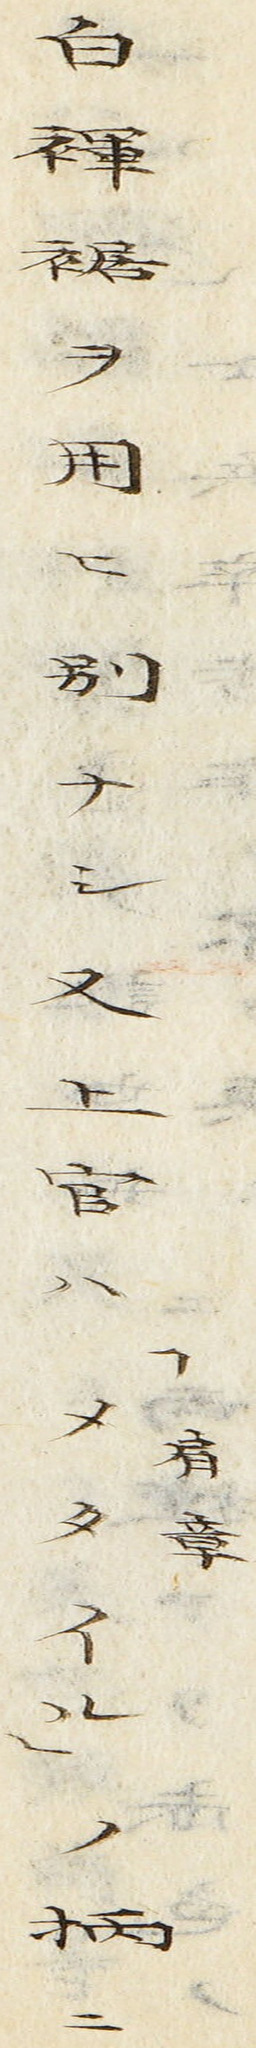白褌裾ヲ用ヒ別ナシ又上官ハ「メタイル」ノ柄ニ
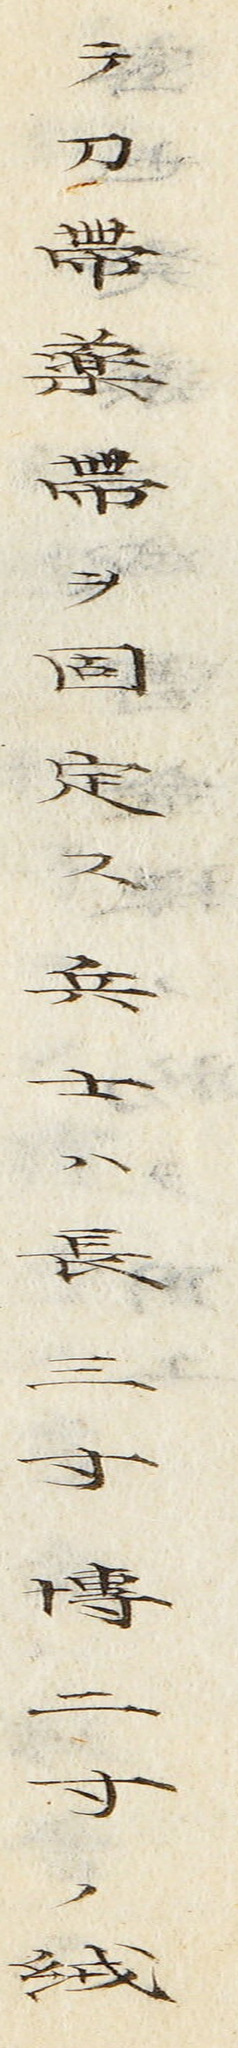テ刀帯薬帯ヲ固定ス兵士ハ長三寸博二寸ノ絨
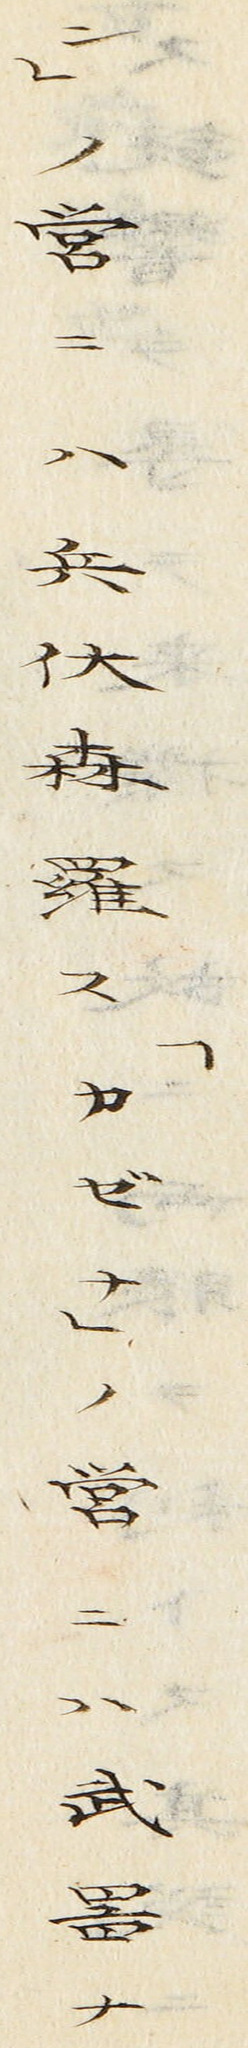ン」ノ営ニハ兵伏森羅ス「カゼナ」ノ営ニハ武器ナ
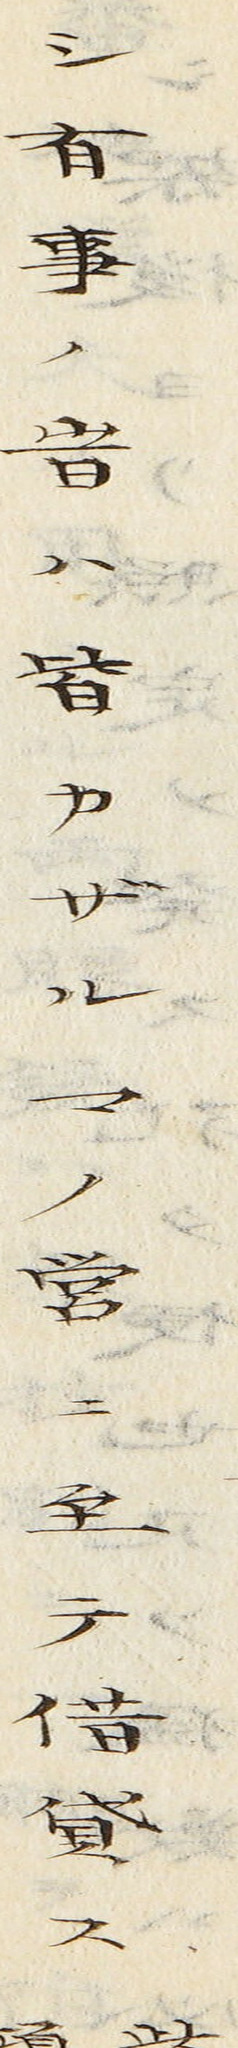シ有事ノ時ハ皆カザルマノ営ニ至テ借貸ス此項
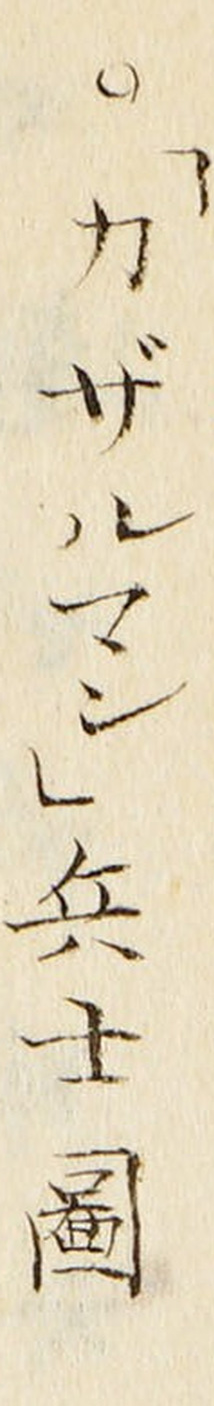〇「カザルマン」兵士図
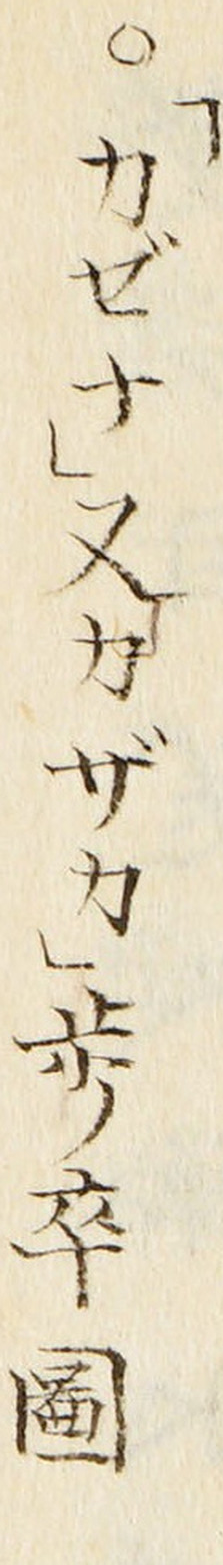〇「カゼナ」又「カザカ」歩卒図

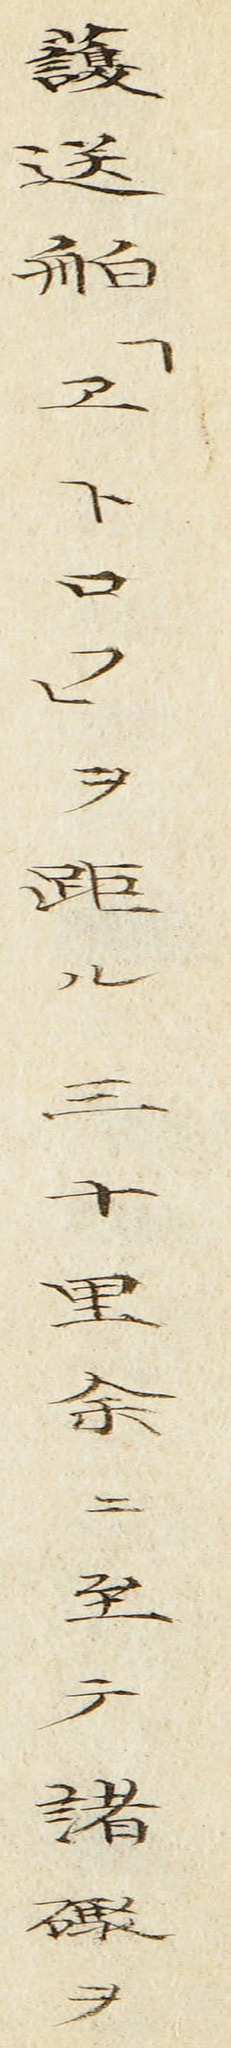〇護送舶「ヱトロフ」ヲ距ル三十里余ニ至テ諸礟ヲ
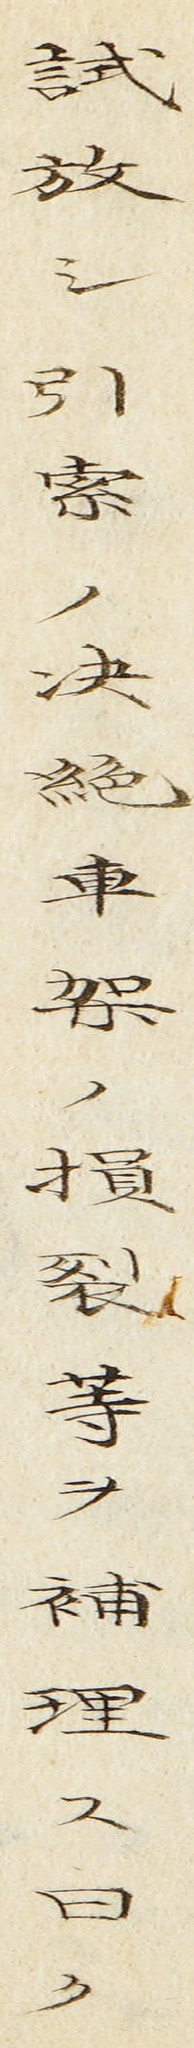試放シ引索ノ決絶車架ノ損裂等ヲ補理ス曰ク
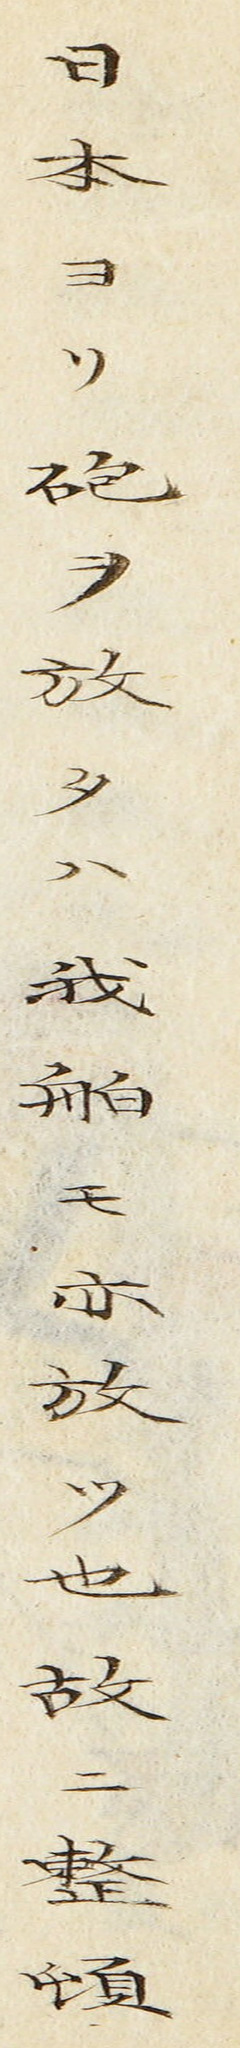日本ヨリ砲ヲ放タハ我舶モ亦放ツ也故ニ整頓
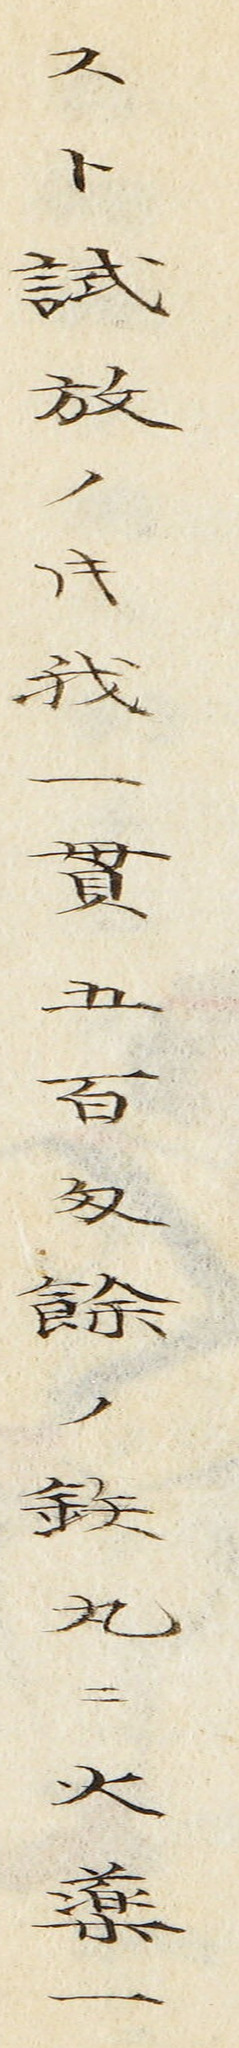スト試放ノトキ我一貫五百匁余ノ鉄丸ニ火薬一
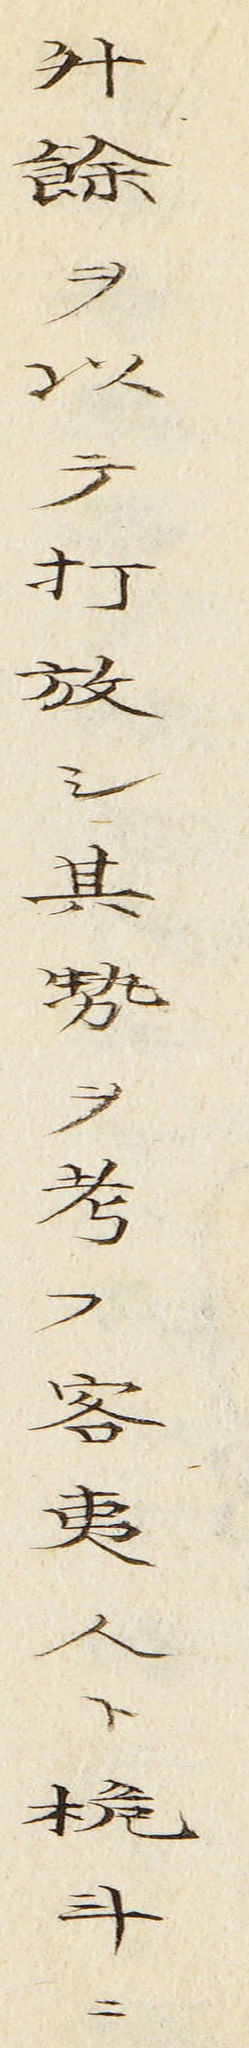升余ヲ以テ打放シ其勢ヲ考フ客夷人ト桅斗ニ
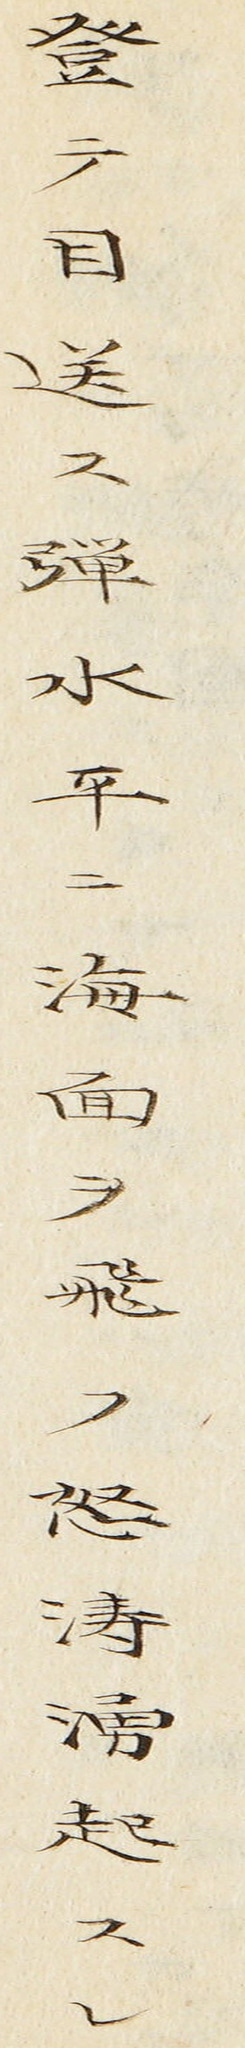登テ目送ス弾水平ニ海面ヲ飛フ怒涛湧起スレ
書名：蕃談
